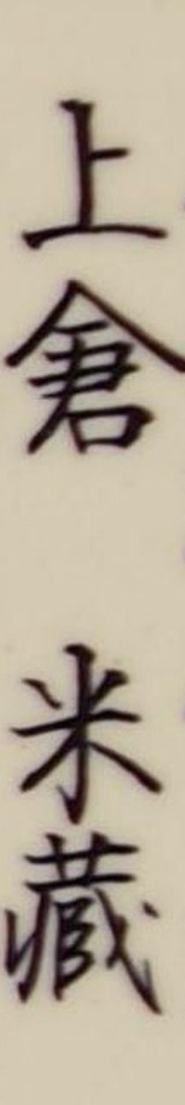上倉米蔵
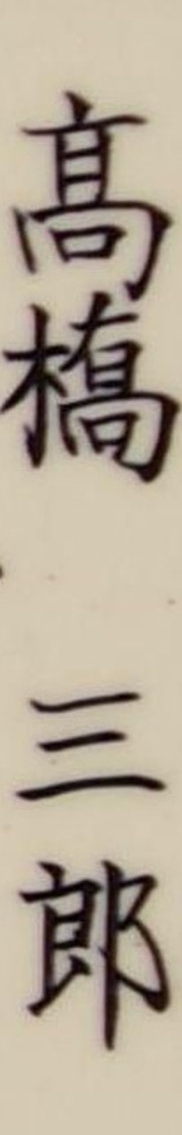高橋三郎
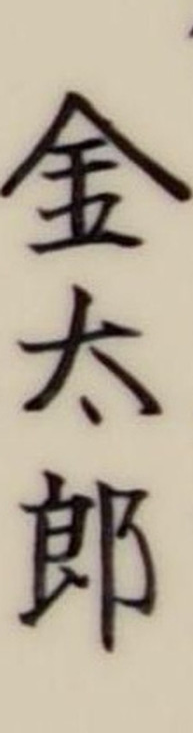金太郎
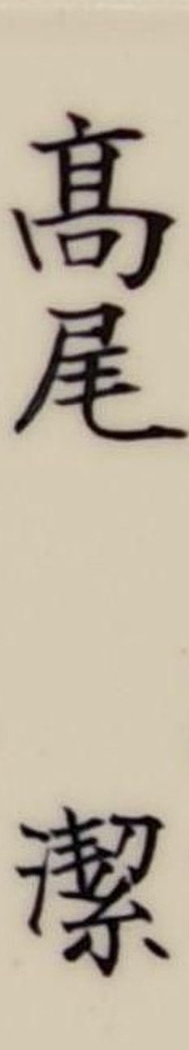高尾潔
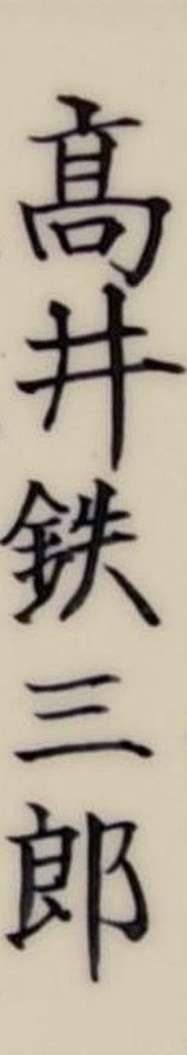高井鉄三郎
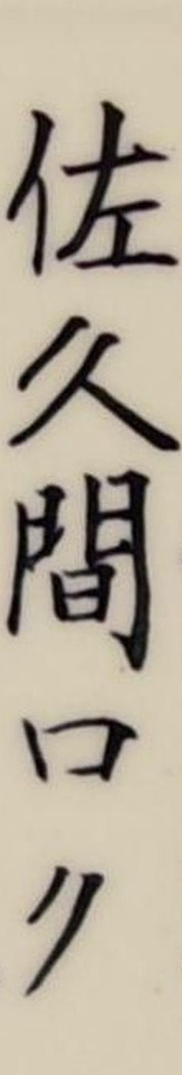佐久間ロク
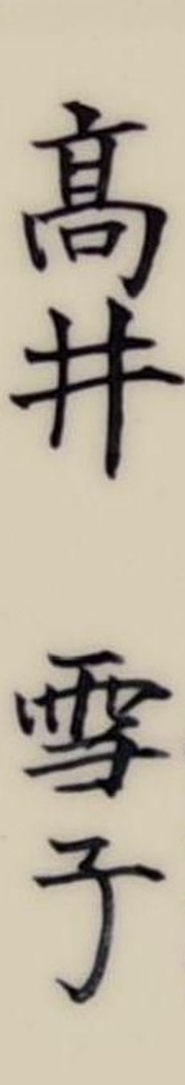高井雪子
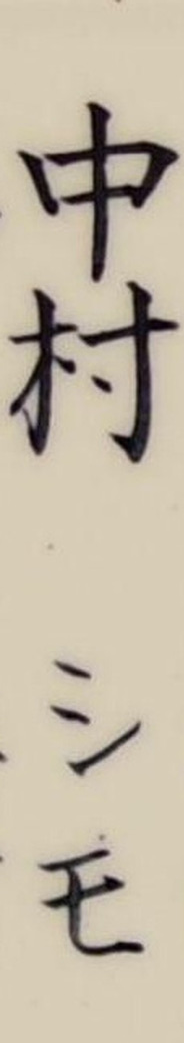中村シモ
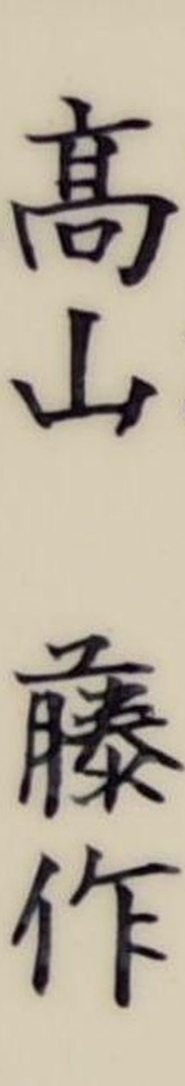高山藤作
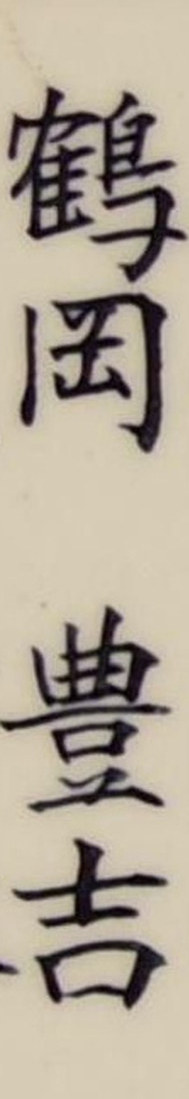鶴岡豊吉
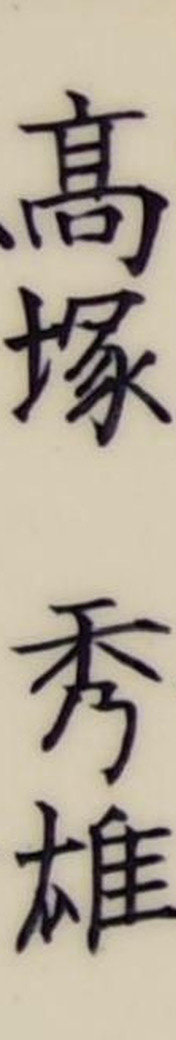高塚秀雄
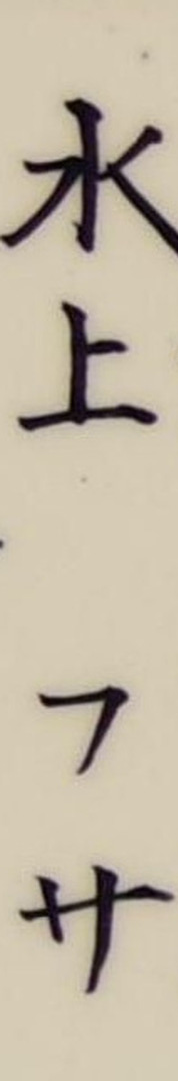水上フサ
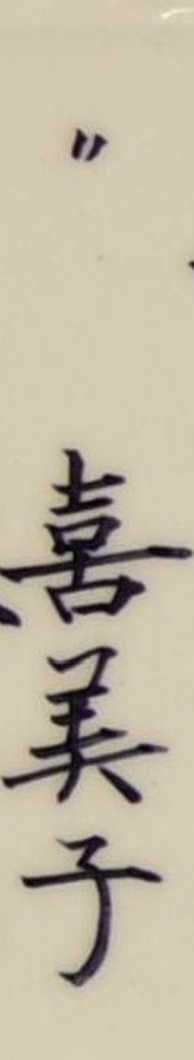喜美子
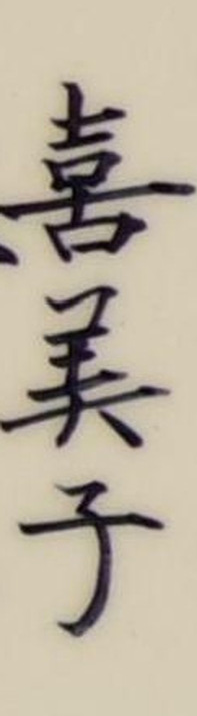喜美子
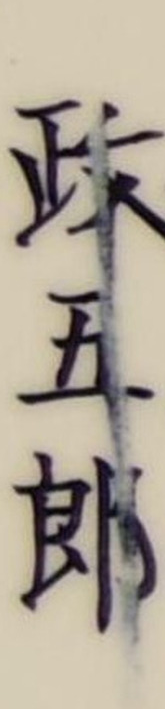政五郎
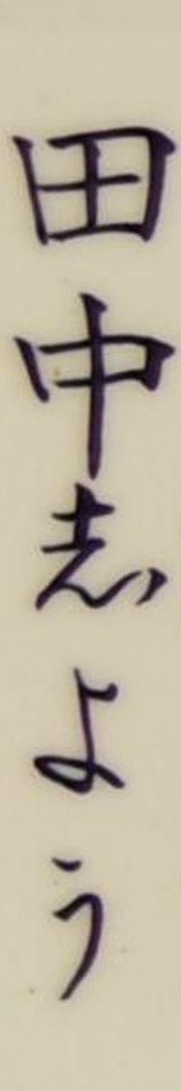田中しよう
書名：A~D
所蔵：koyasan kongobuji
